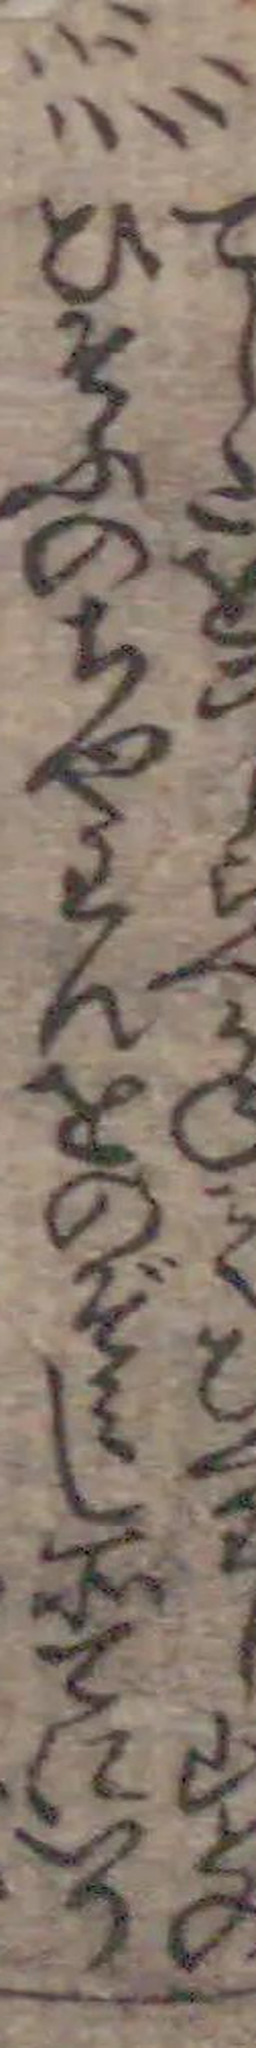ひそふのちやわんをのぞみし所てにいり
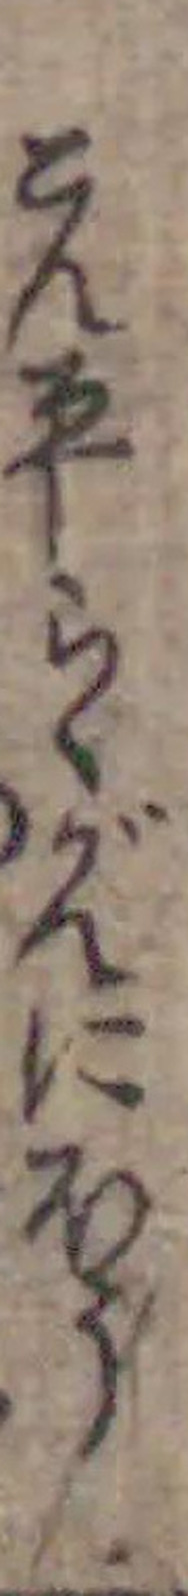こん平らくがんにほう
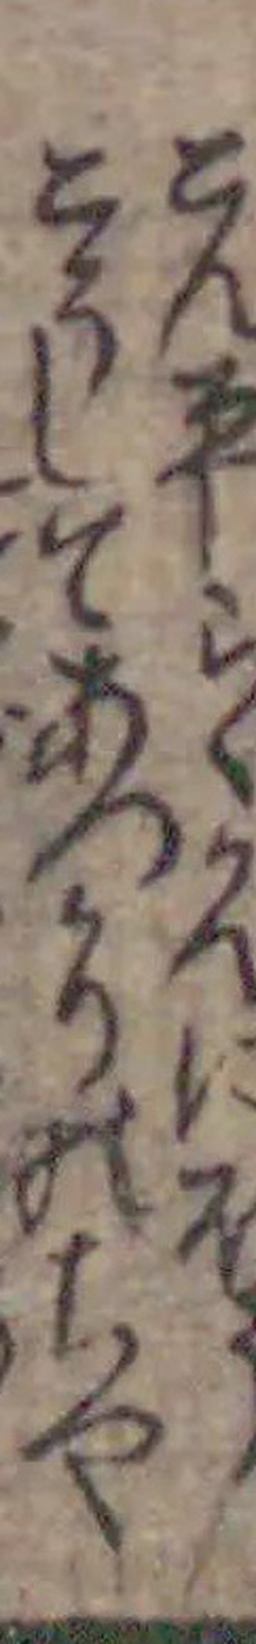こうしてあつかりのちや
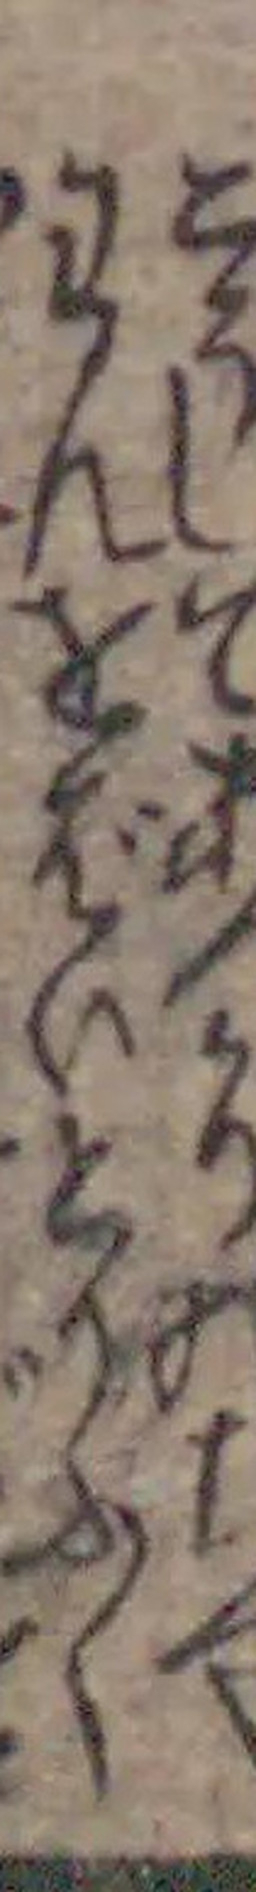わんをばいとりふく
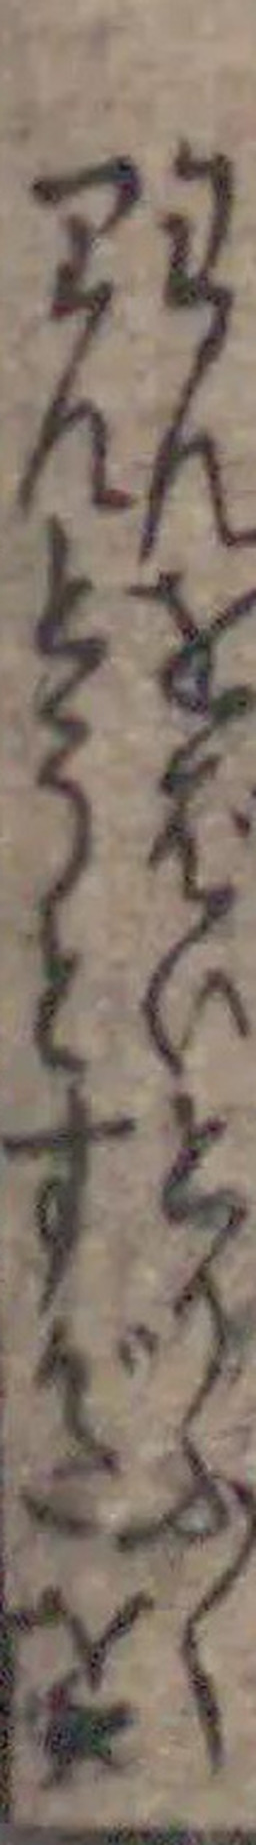りんとうとすがたを
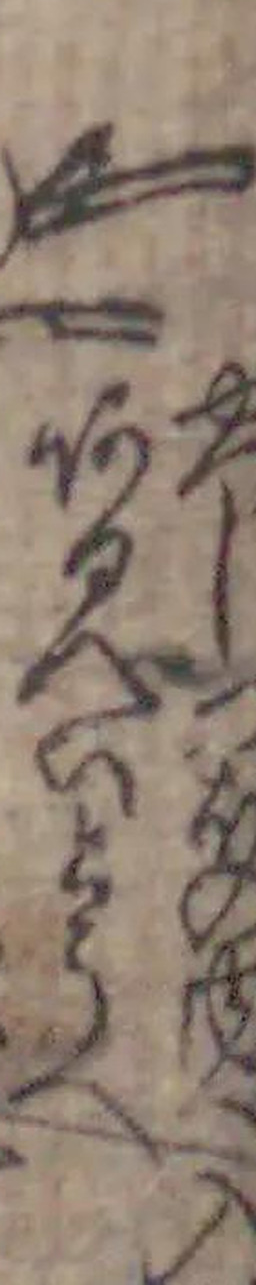あるへいとうへ
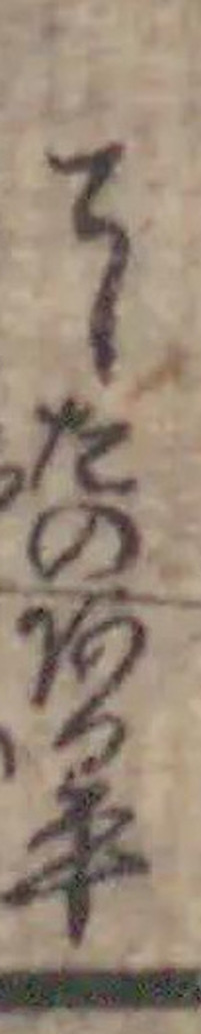てしたのある平
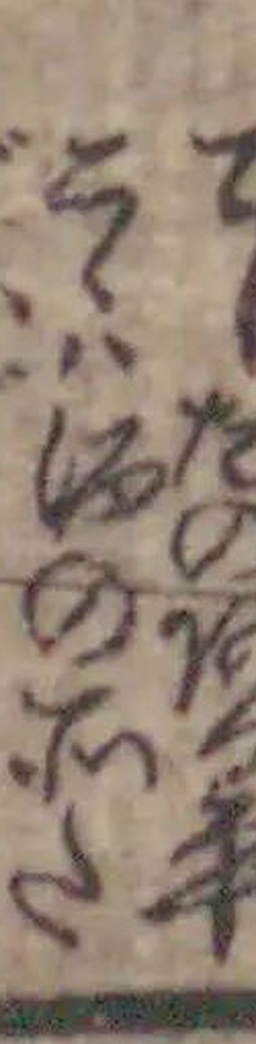こゝは酒の所た
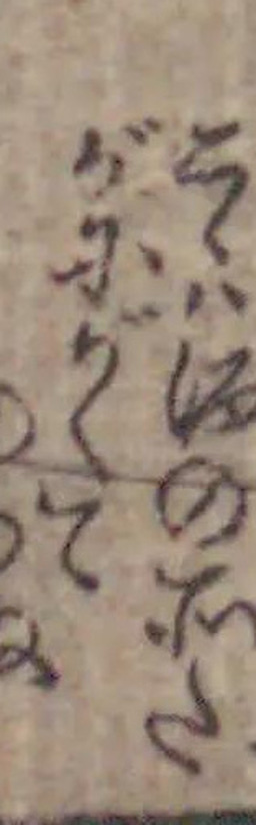がにがくて
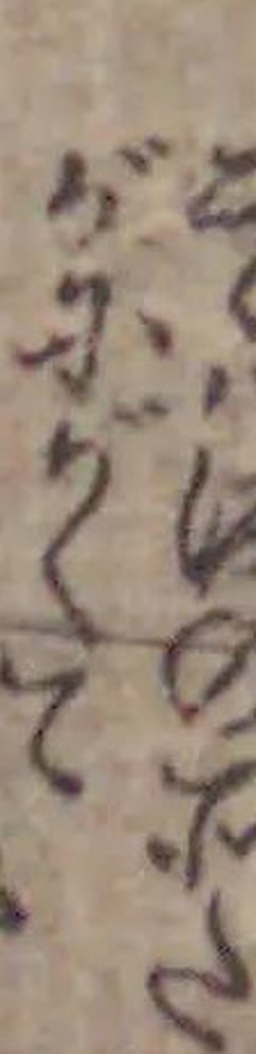がにがくて
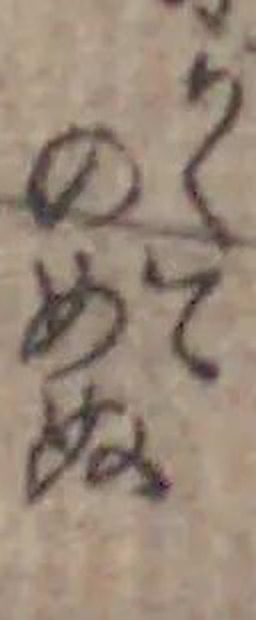のめぬ
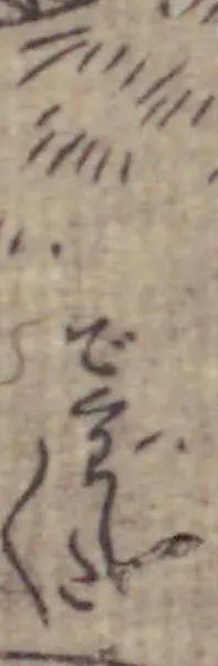でくわした
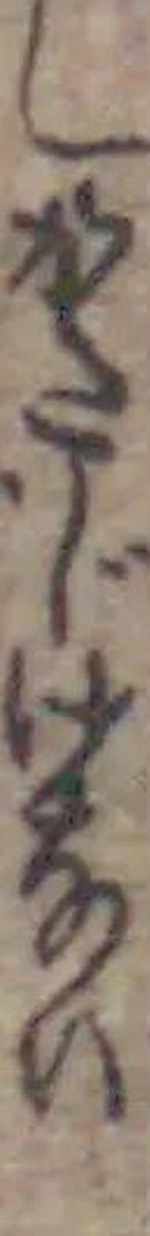かたじけない
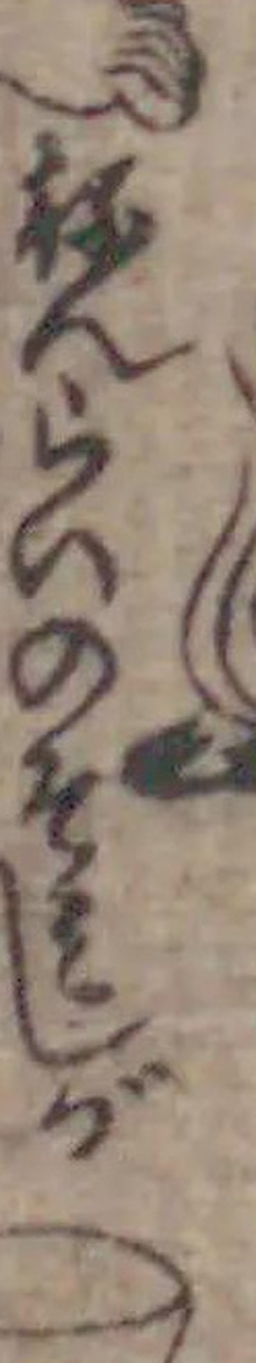ねんらいのそみしが
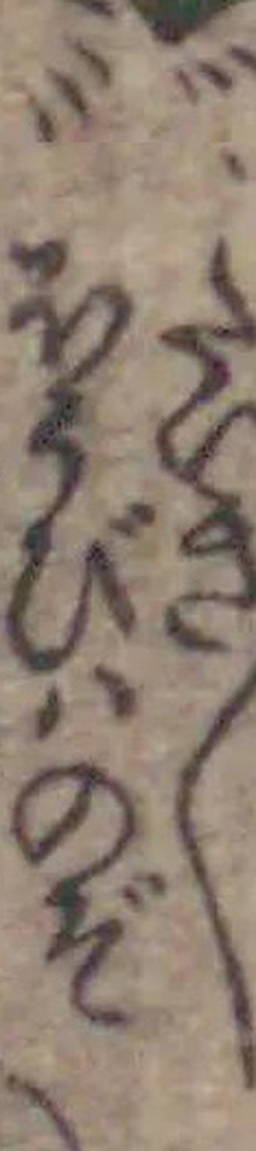ほうびはのぞ
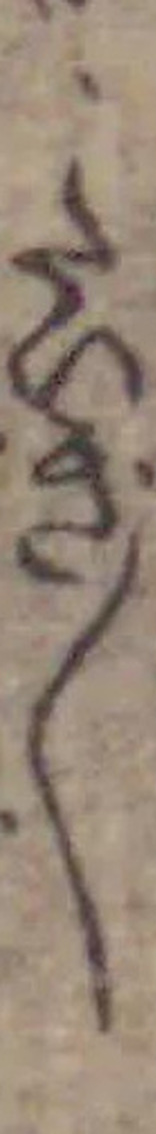たいぎ〳〵
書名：名代干菓子山殿 3巻
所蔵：国立国会図書館 National Diet Library, JAPAN
